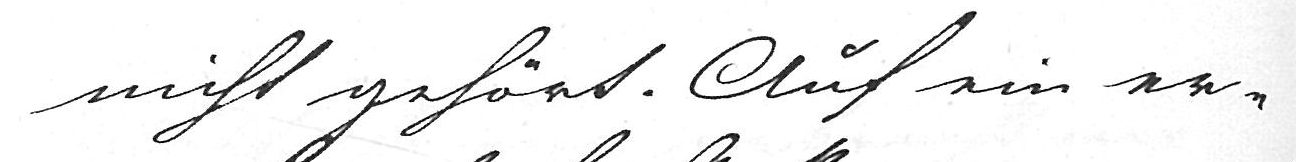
nicht gehört. Auf ein er-
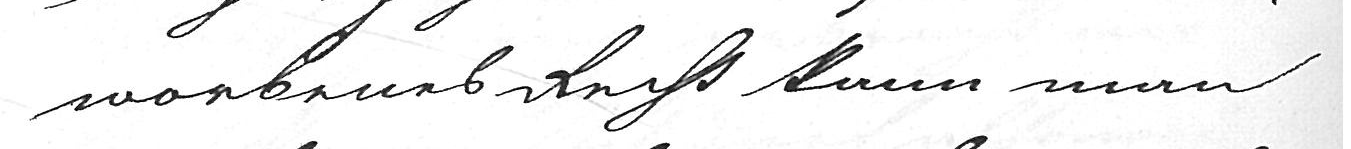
worbenes Recht kann man
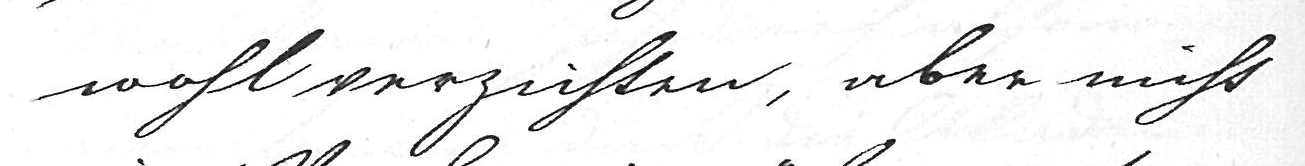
wohl verzichten, aber nicht
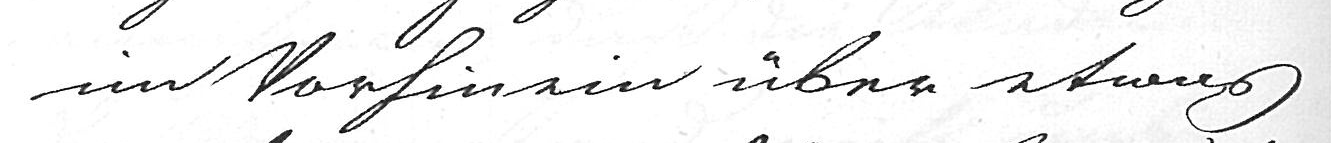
im Vorhinein über etwas
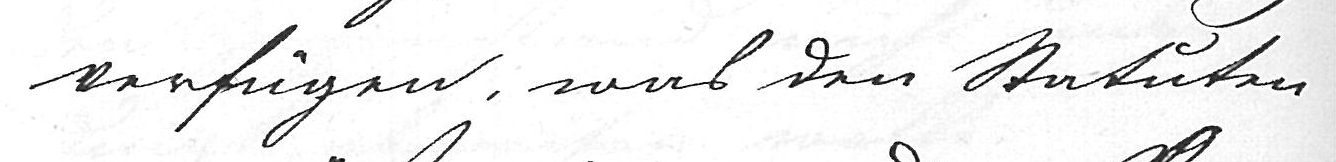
verfügen, was den Statuten
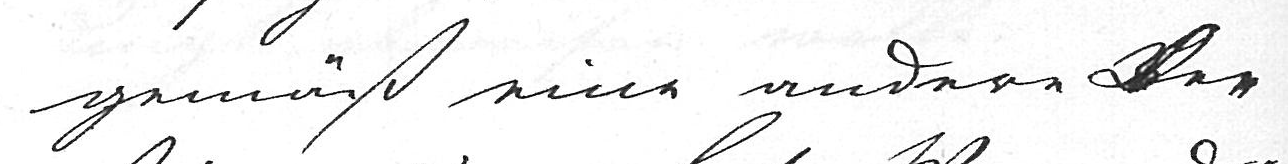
gemäß eine andere Ver-
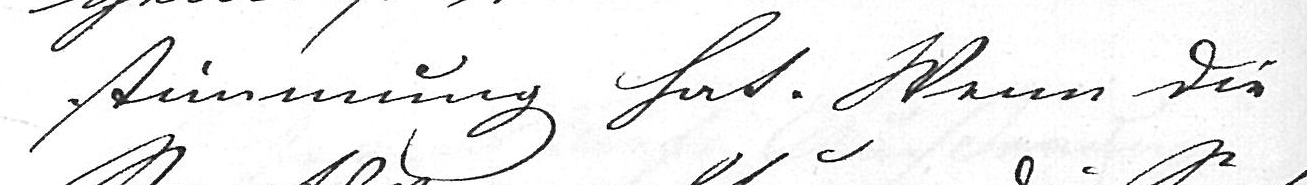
stimmung hat. Wenn die
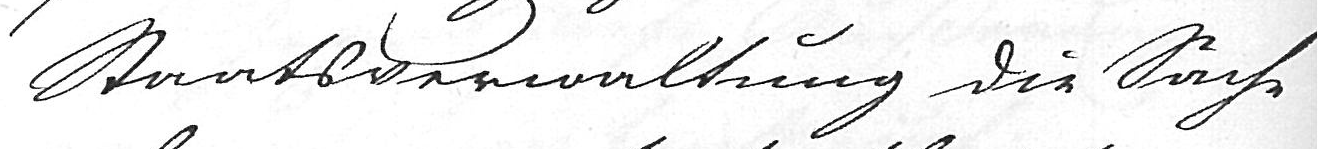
Staatsverwaltung die Sache
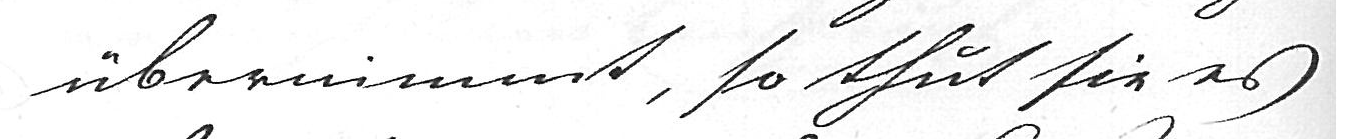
übernimmt, so thut sie es
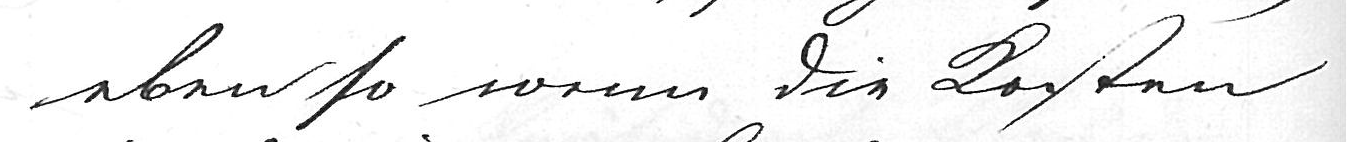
eben so wenn die Kosten
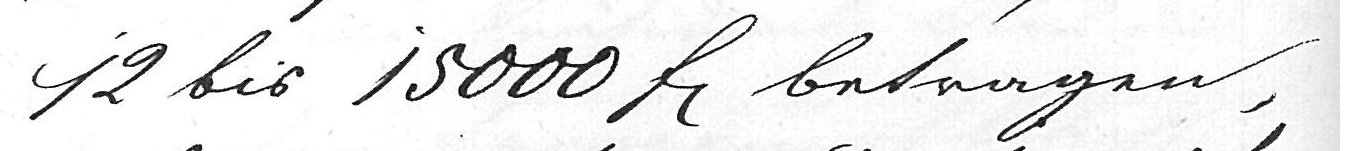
12 bis 15000 fl betragen,
